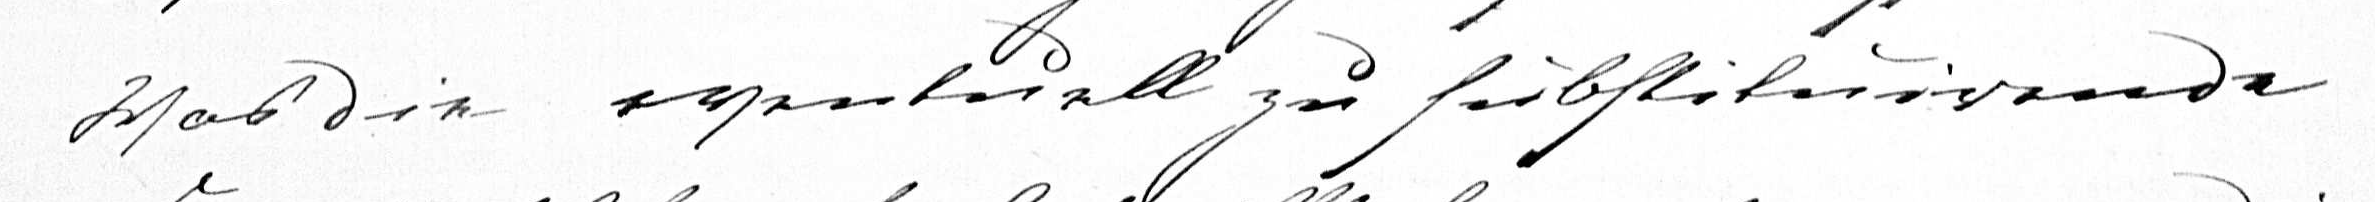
Was die eventuell zu substituirende
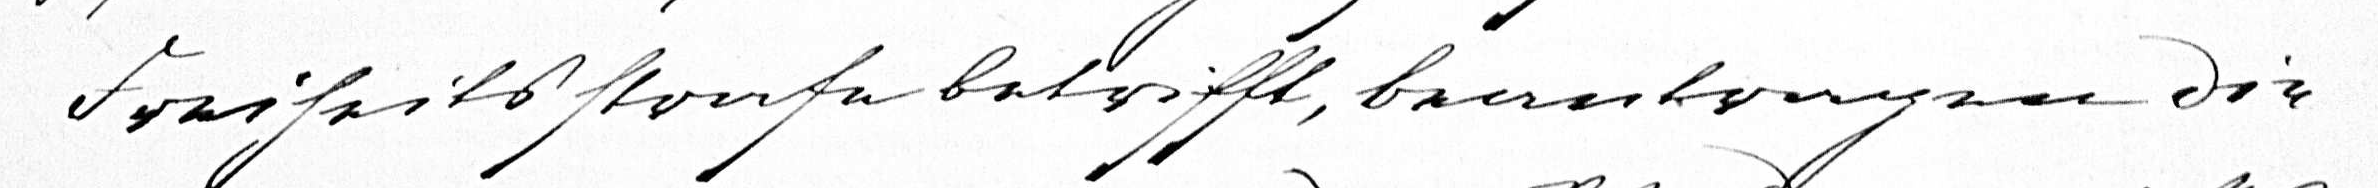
Freiheitsstrafe betrifft, beantragen die
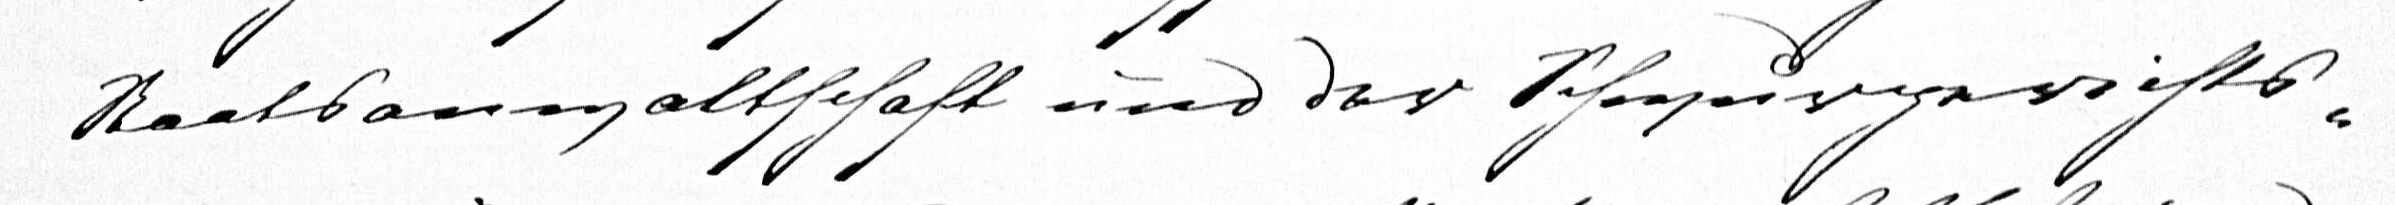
Staatsanwaltschaft und der Schwurgerichts¬
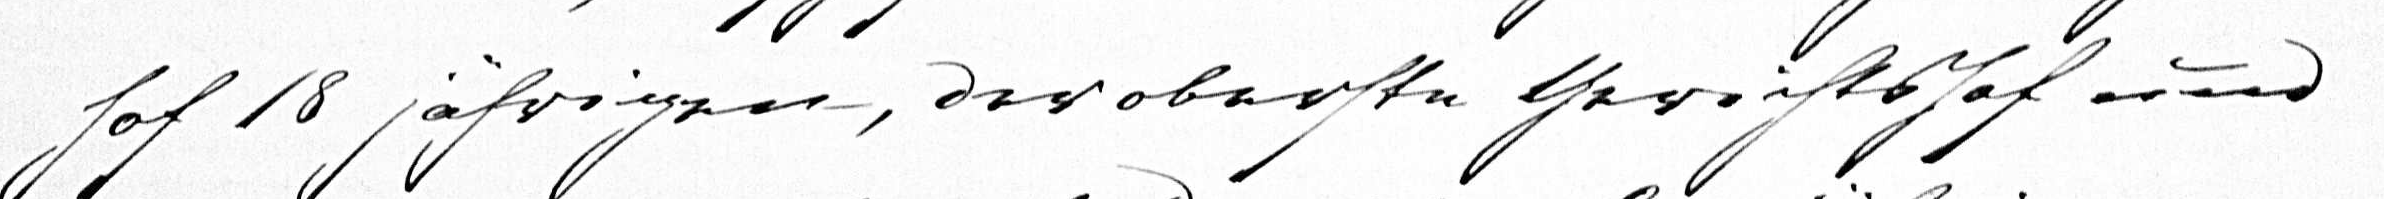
hof 18 jährigen, der oberste Gerichtshof und
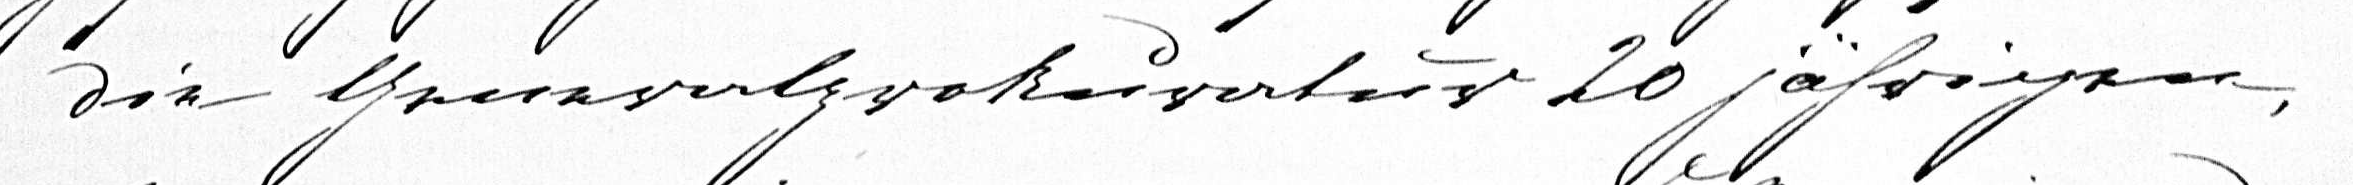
die Generalprokuratur 20 jährigen,
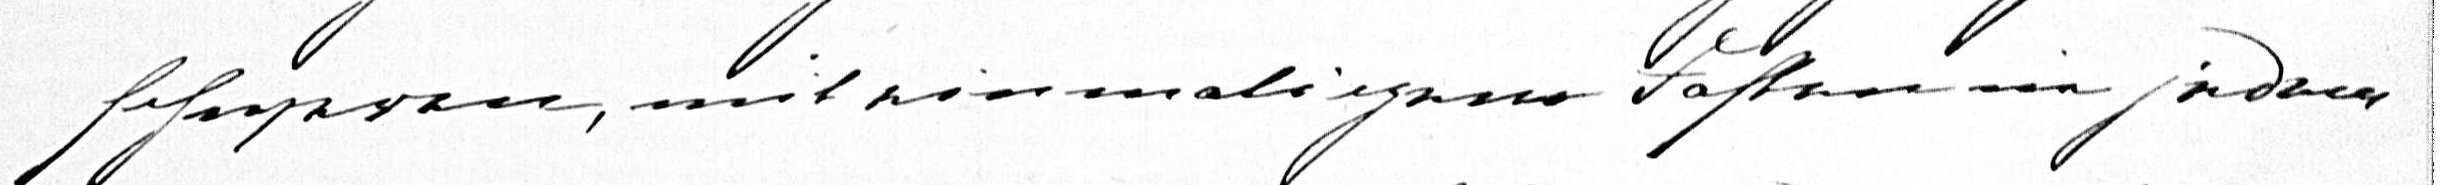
schweren, mit einmaligem Fasten im jedem
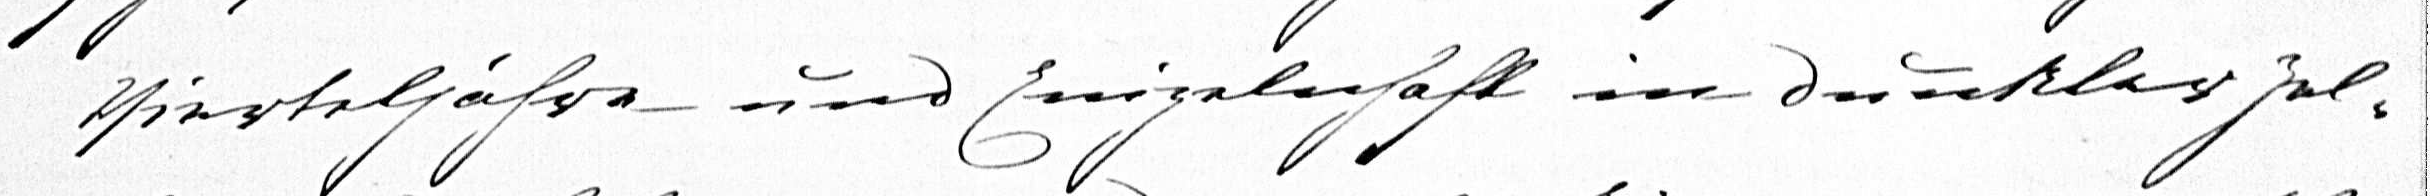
Vierteljahre und Einzelnhaft in dunkler Zel¬
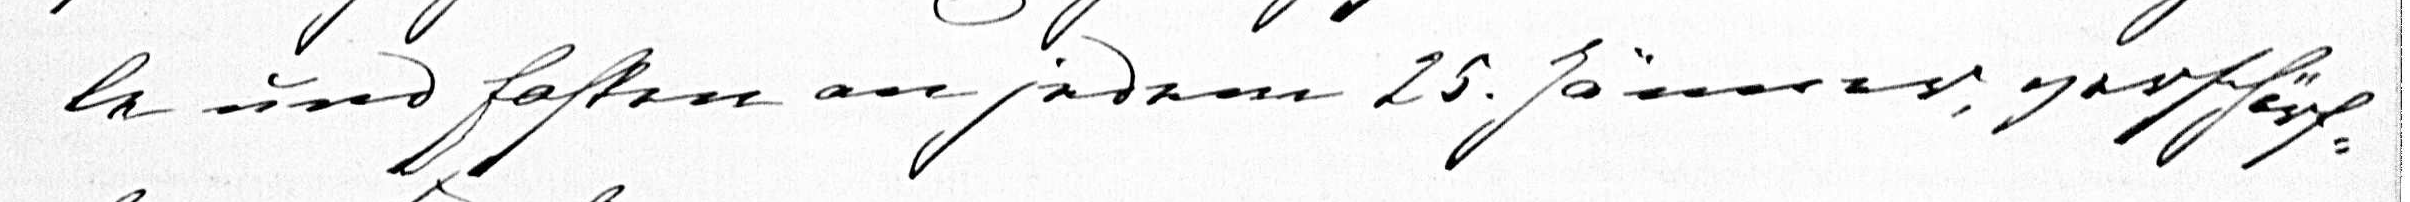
le und Fasten an jedem 25. Jänner, verschärf¬
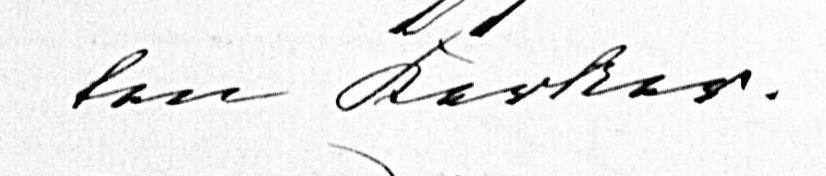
ten Kerker.
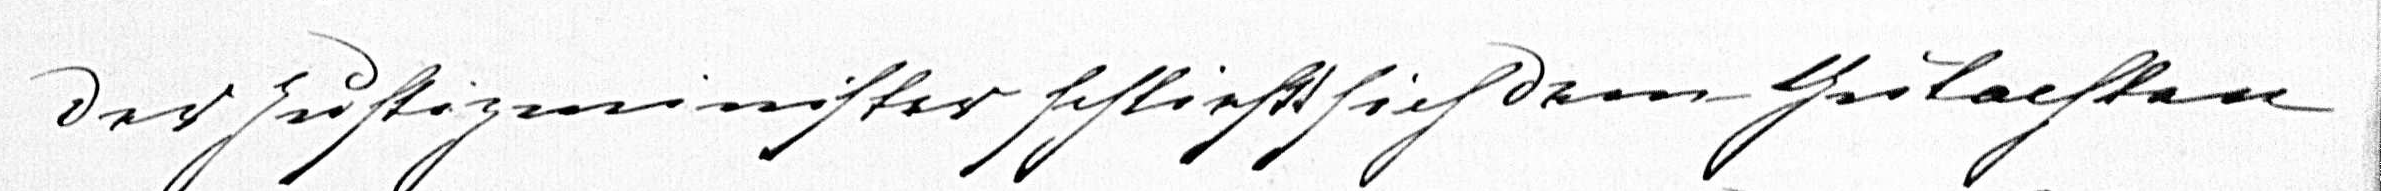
Der Justizminister schließt sich dem Gutachten
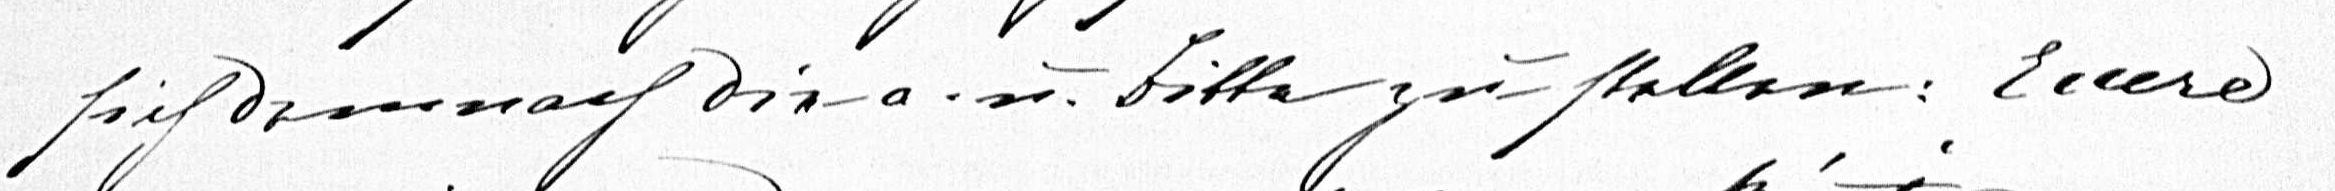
sich dem nach die a. u. Bitte zu stellen: Eucre
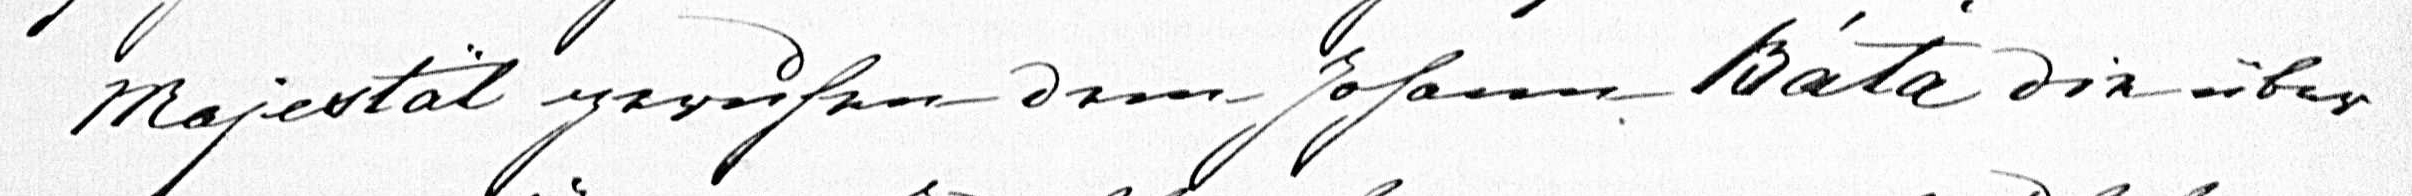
Majestät gerufen dem Johann Báta die über
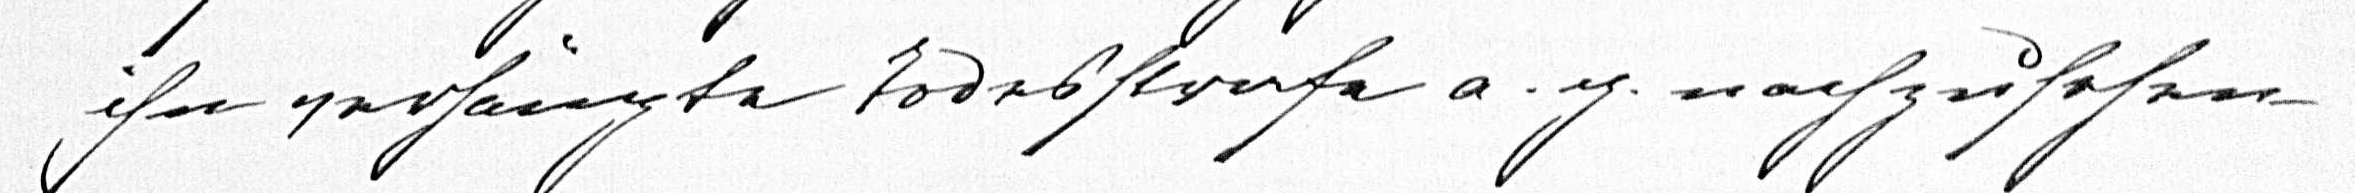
ihn verhängte Todesstrafe a. g. nachzusehen
